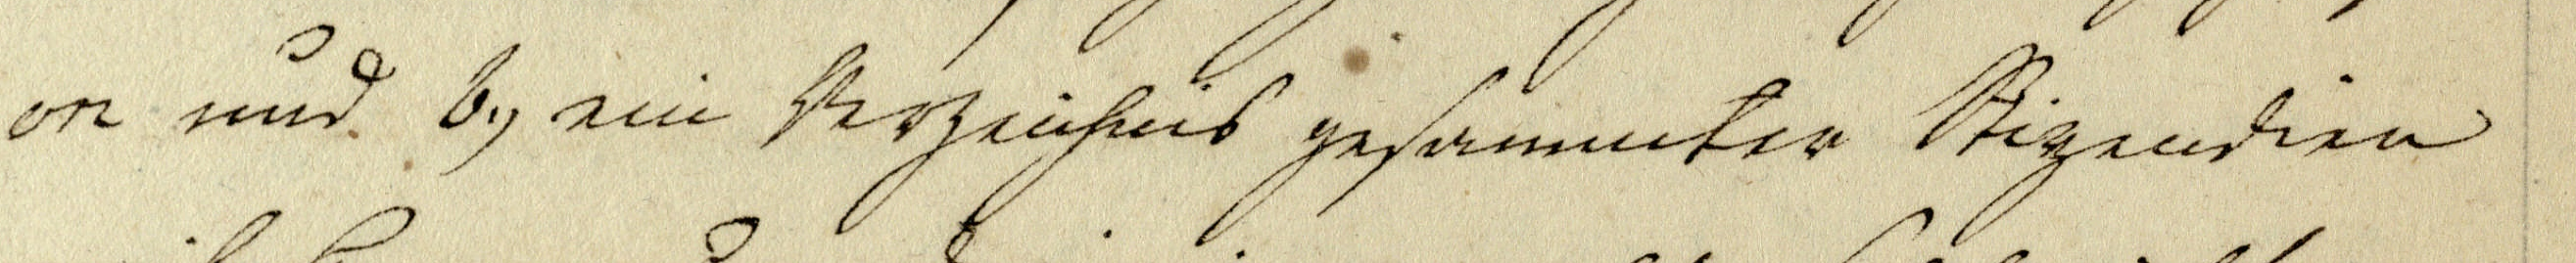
on und b., ein Verzeichnis gesammter Stipendien
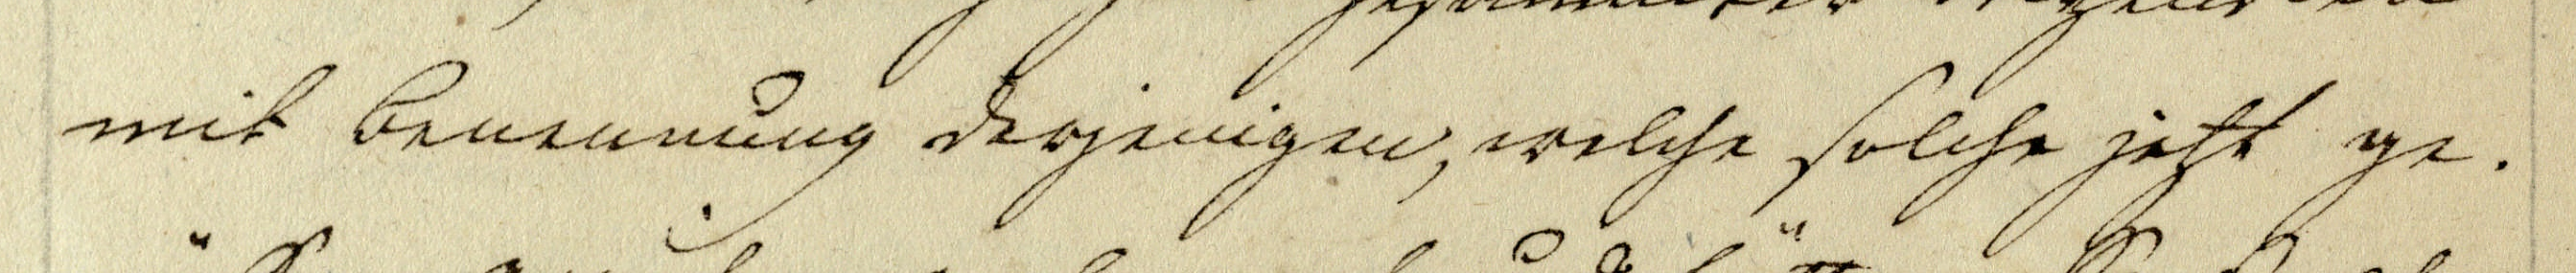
mit Benennung derjenigen, welche solche jetzt ge¬
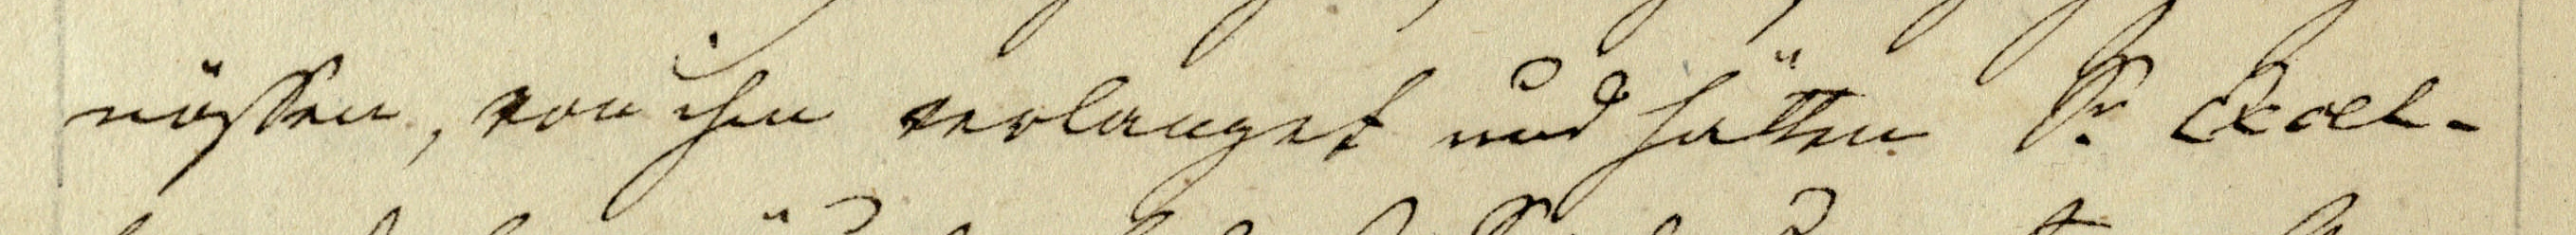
nössen, von ihm verlanget und hätten Sr Excel¬
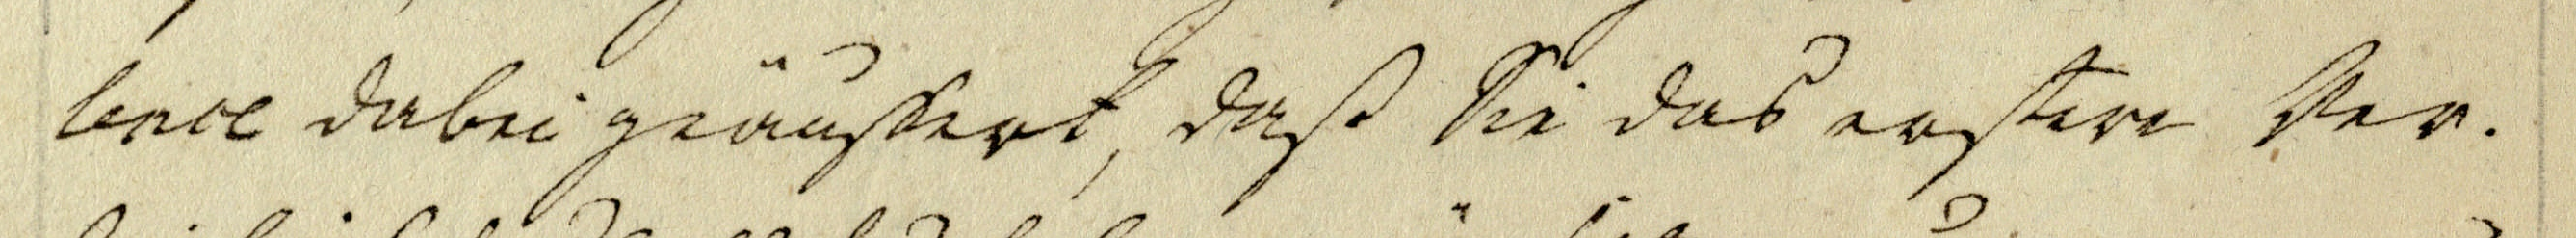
lence dabei geäussert, daß Sie das erstere Ver¬
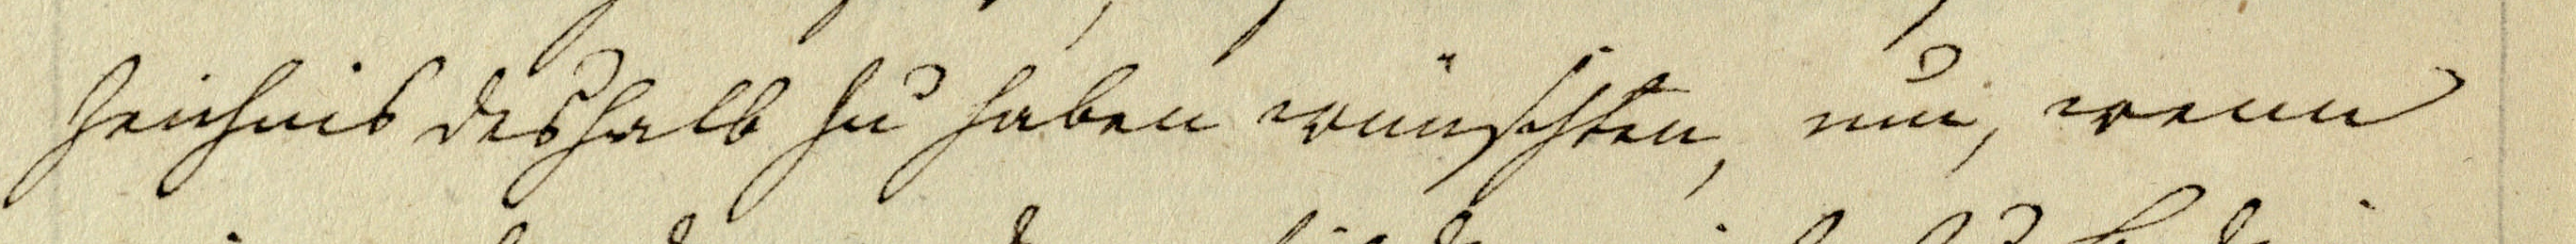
zeichnis deshalb zu haben wünschten, um, wenn
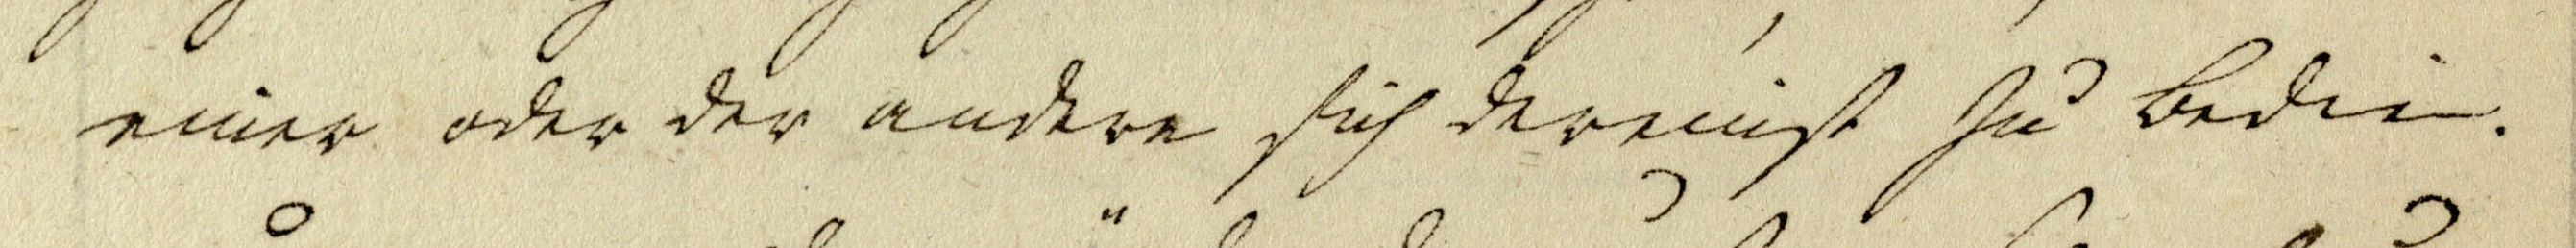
einer oder der andere sich dereinst zu Bedie¬
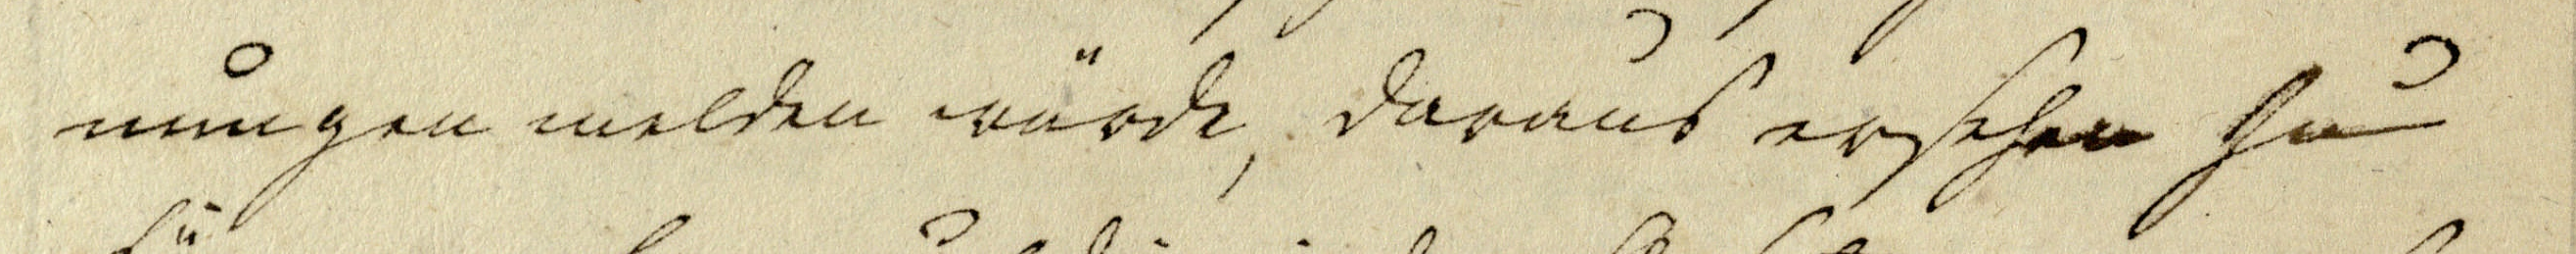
nungen melden würde, daraus ersehen zu
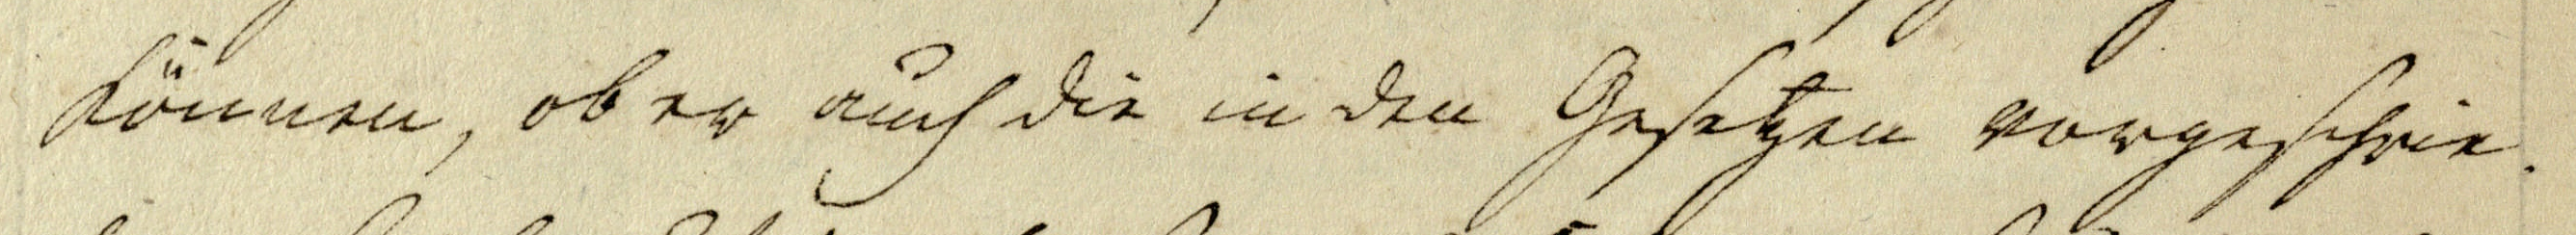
können, ob er auch die in den Gesetzen vorgeschrie¬
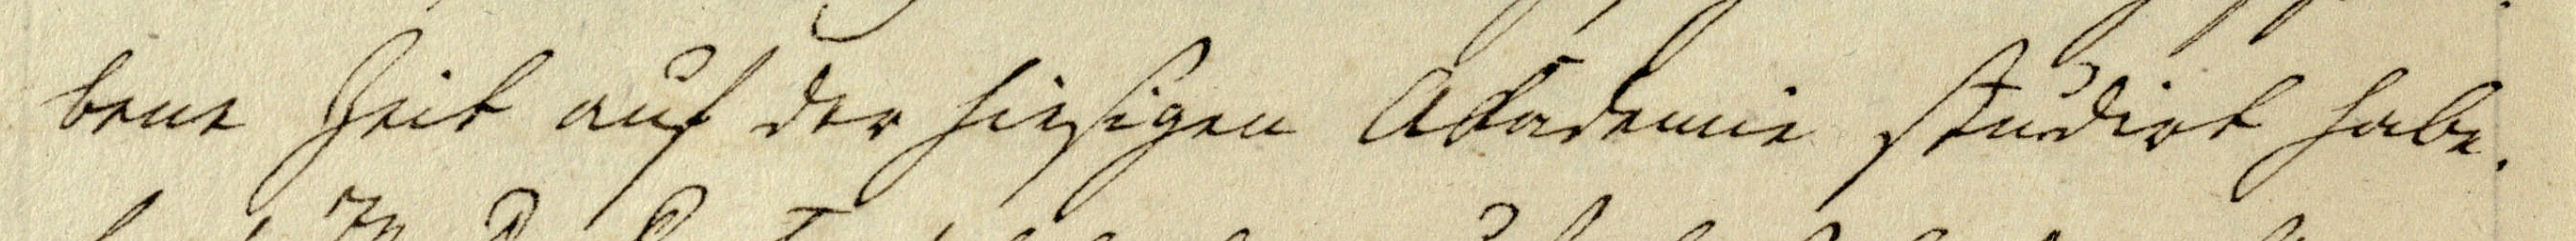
bene Zeit auf der hiesigen Akademie studirt habe,
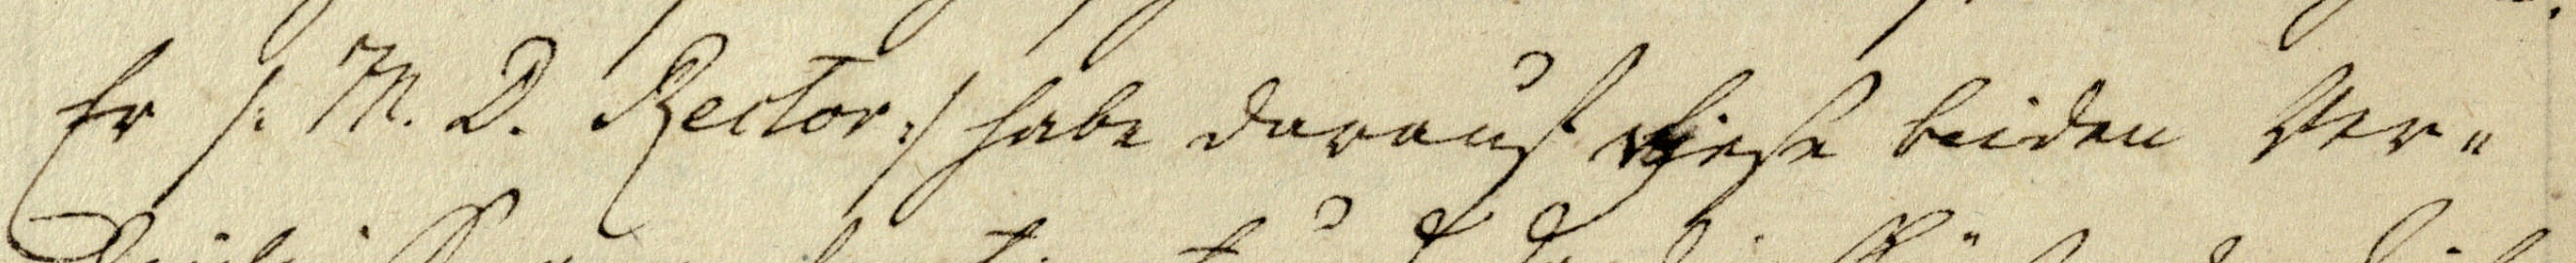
Er /. M. D. Rector :/ habe darauf diese beiden Ver¬
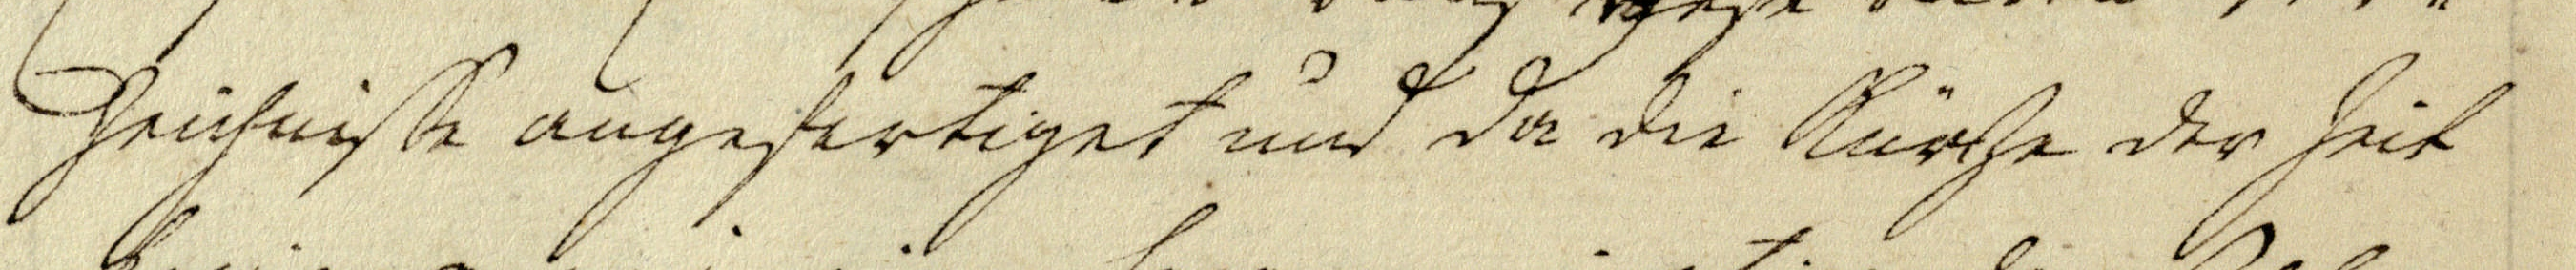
zeichnisse angefertiget und da die Kürze der Zeit
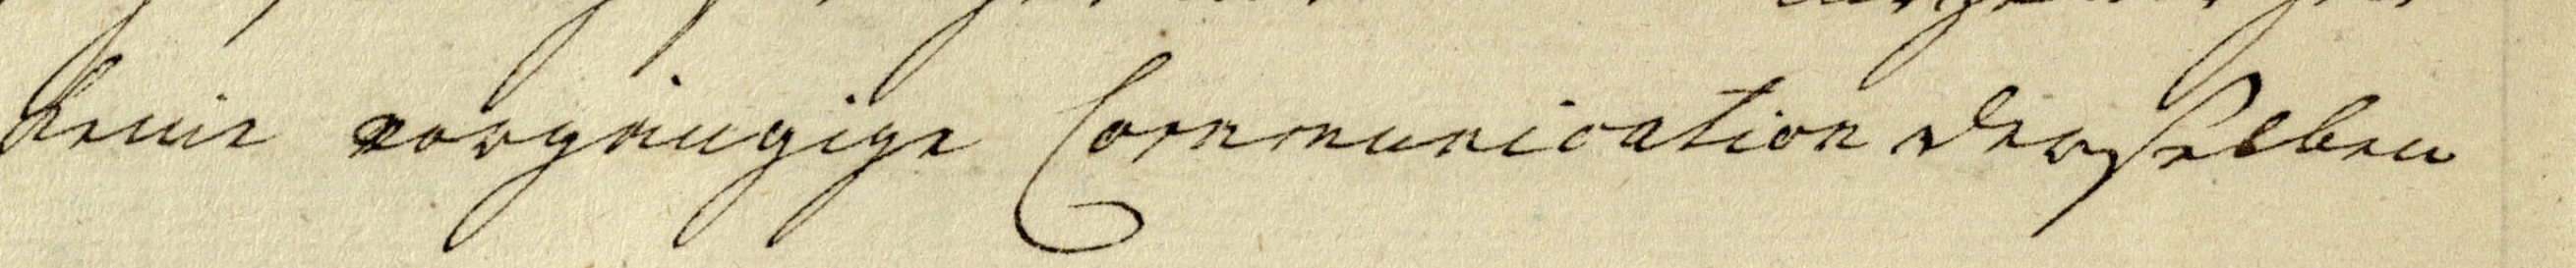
eine vorgängige Communication derselben
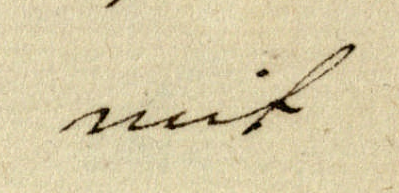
mit
